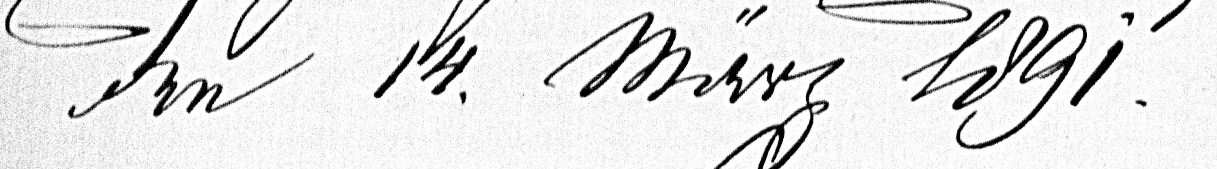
Den 14. März 1891
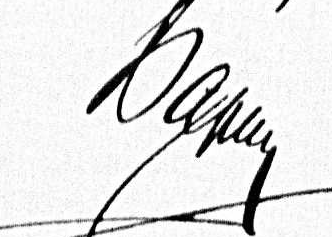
Basny
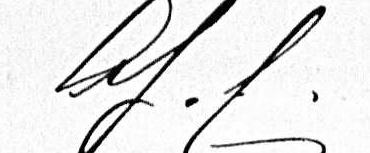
AhE
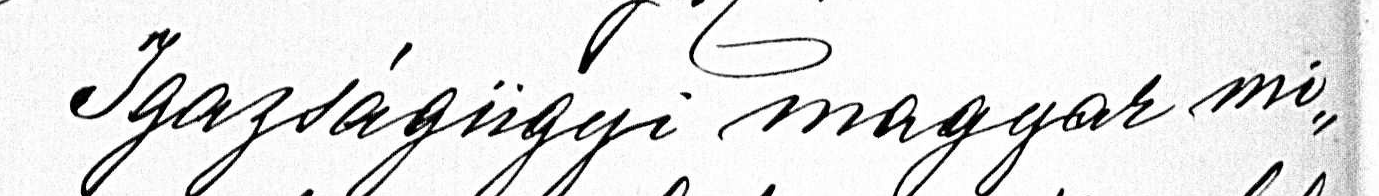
Igazságügyi Magyar mi¬
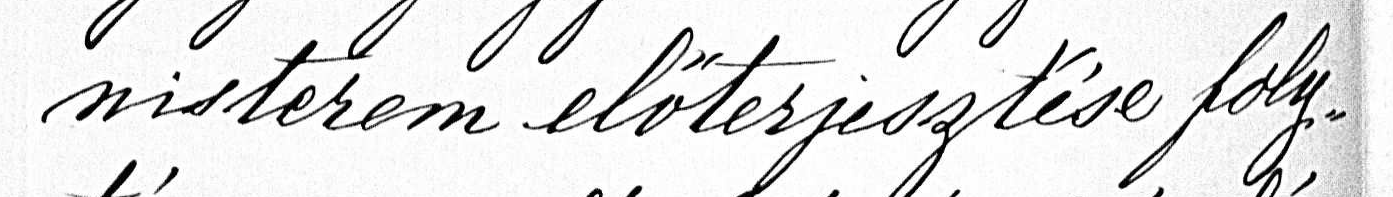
nisterem elöterjesztése foly¬
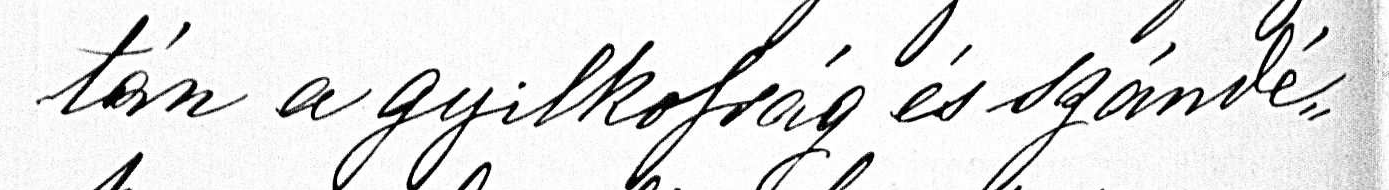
tán a gyilkohság és szándé¬
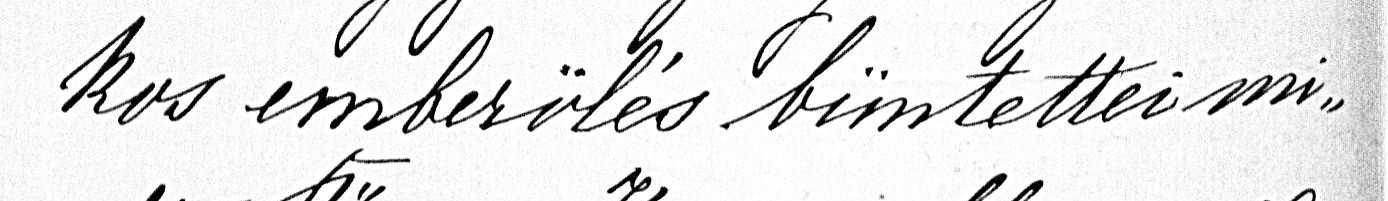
kos emberölés bïmtettei mi¬
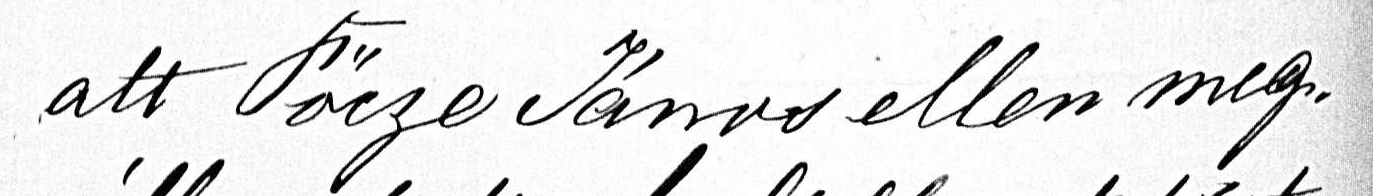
att Pöcze János ellen meg¬
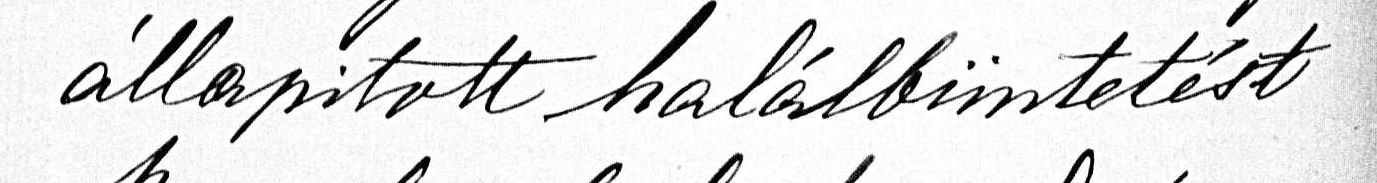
állapitott halálbimtetést
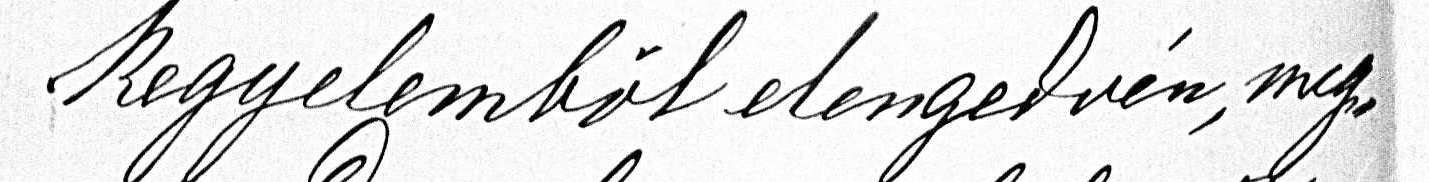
Regyelemböl elengedvén, meg¬
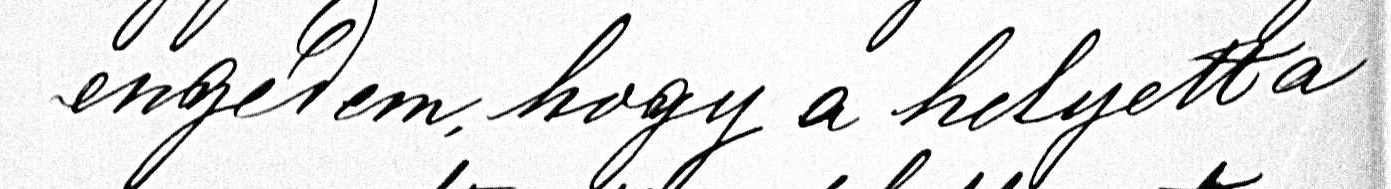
engedem, hogy a helyetta
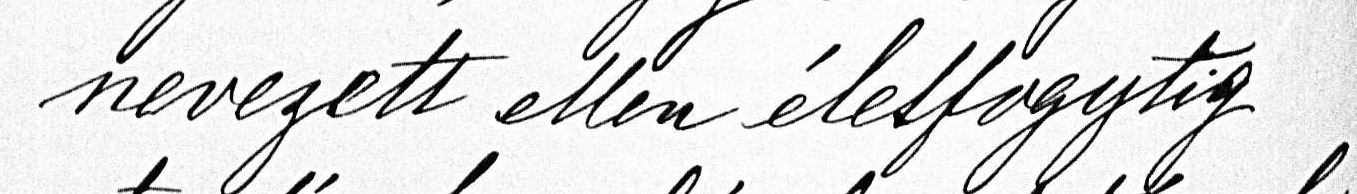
nevezett ellen életfogytig
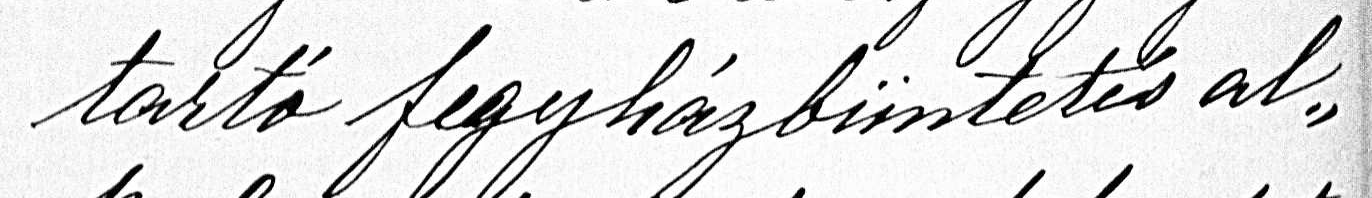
tartó fegyházbimtetes al¬
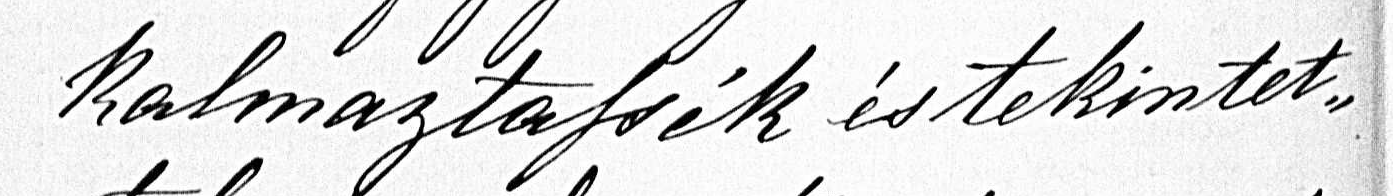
kalmaztahsék éstekintet¬
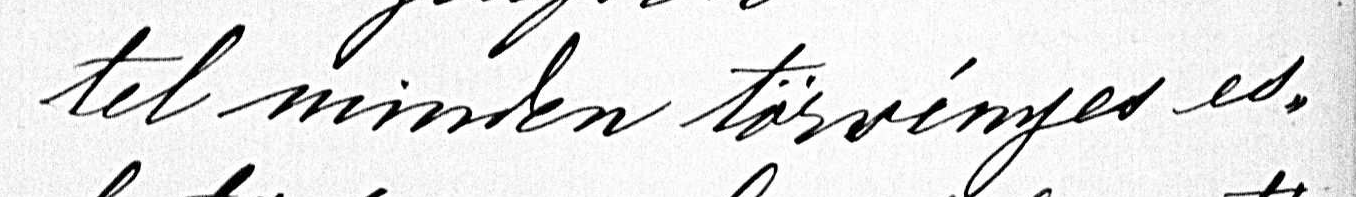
tel minden törveenyes es¬
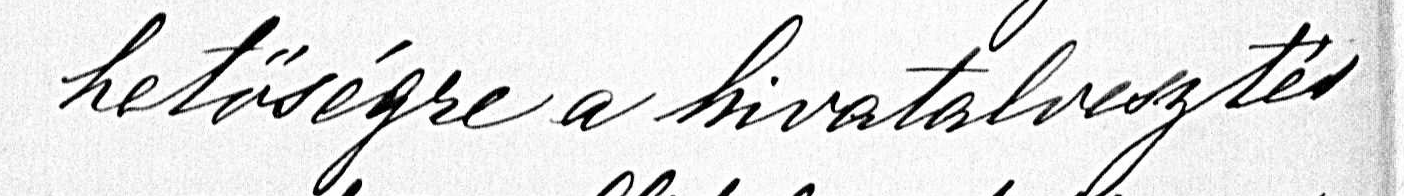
hetöségre a hivatalvesztés
